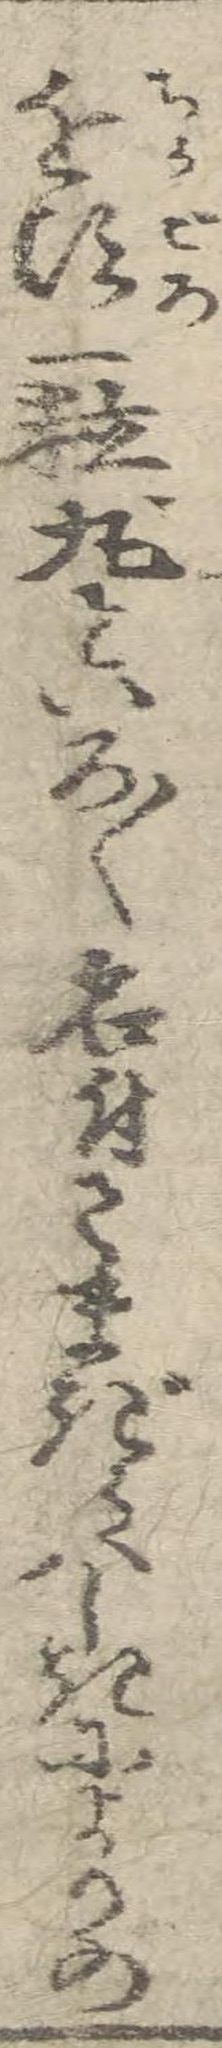近頃一粒丸といろ〳〵名付てまぎらはしきによりの
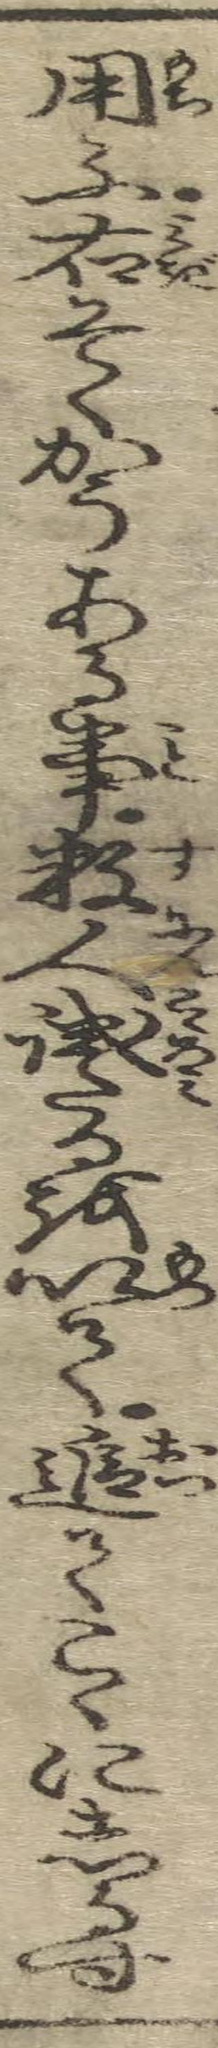用ふ。右そくかうある事。数人試たるを以て。追てこゝにしるす
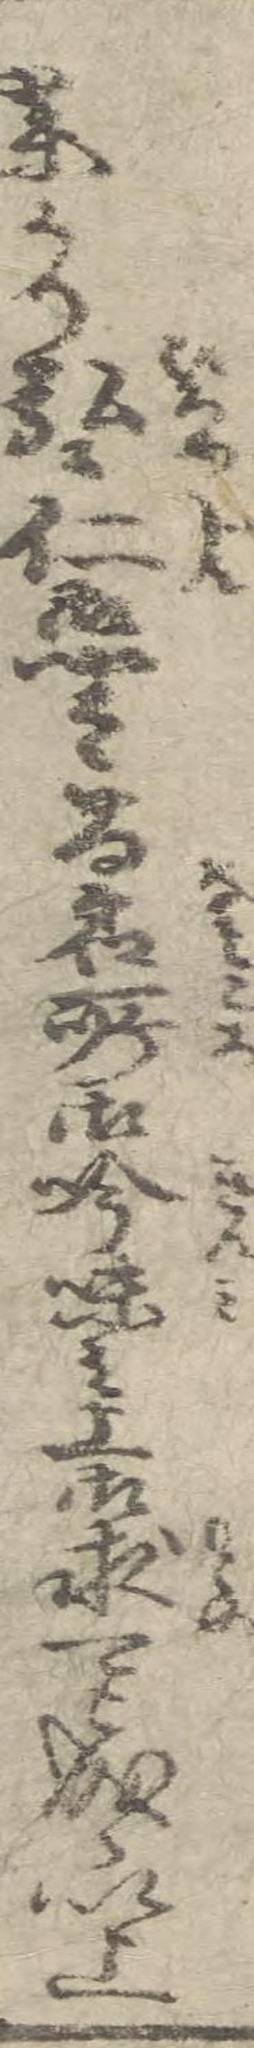薬うり弘て仁する名所御吟味之上御求可被成候以上
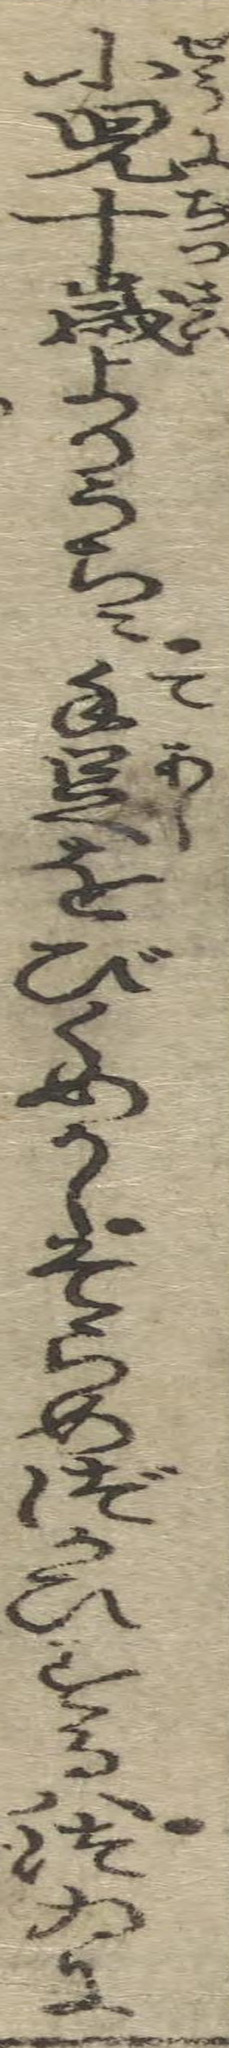小児十歳よりうちに。手足をびくめかし。そらめづかひするは。つゐに
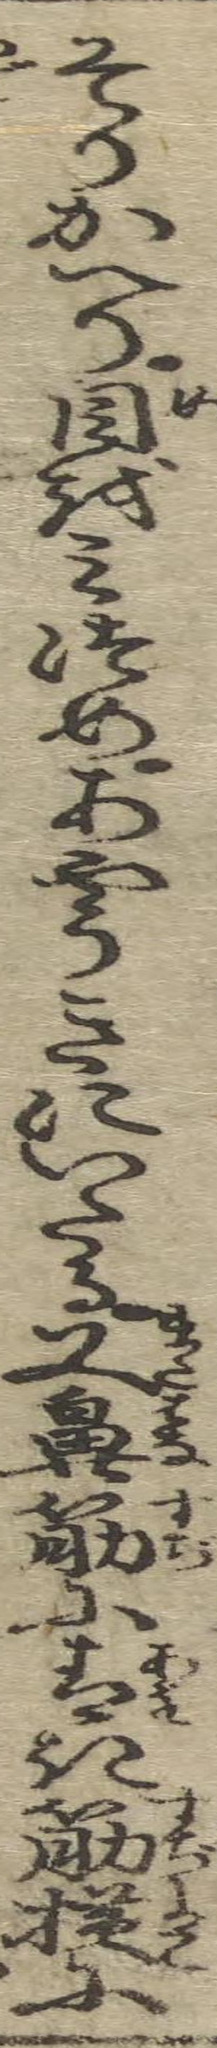そりかへり。目をみつめ。あやうきにいたる。又鼻筋に青き筋横に
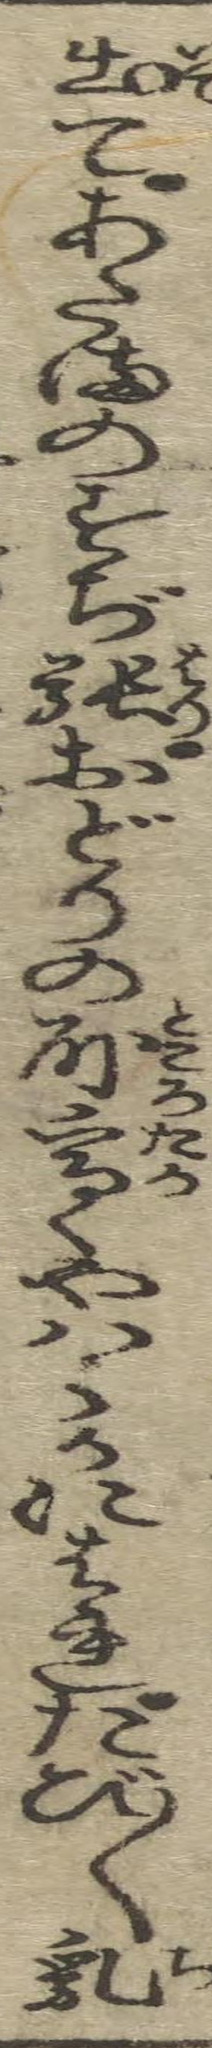出て。あたまのすぢ張。おどりの所高くやはらかにはれ。たび〳〵乳
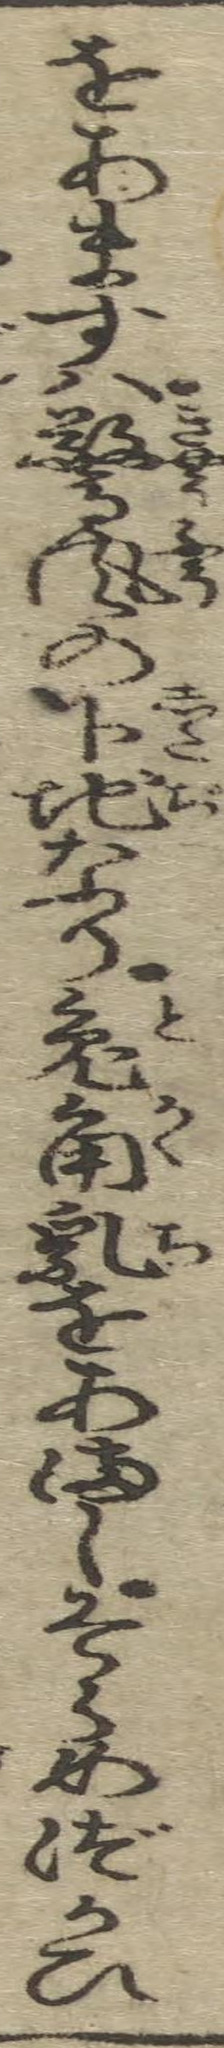をあますは。驚風の下地なり。兎角乳をあまし。そらめづかひ
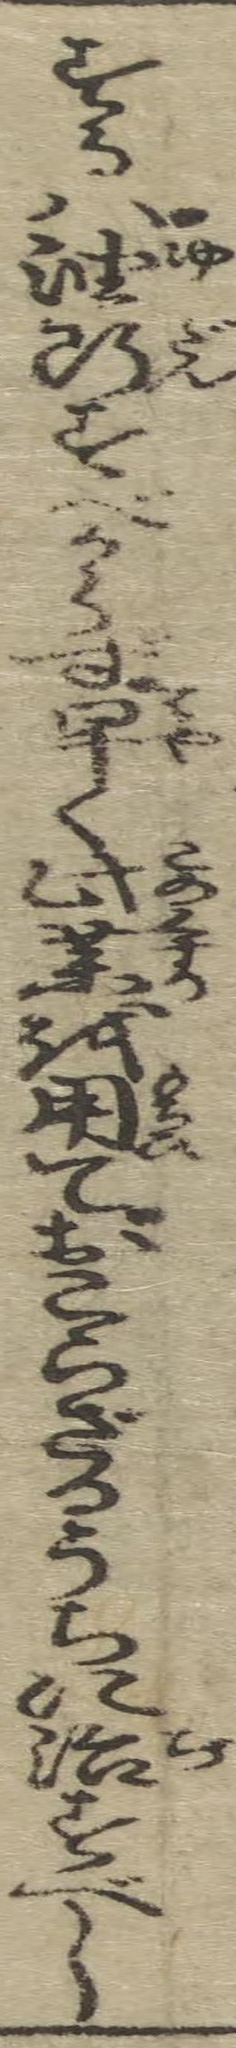するは。油断すべからず。早く此薬を用て。おこらざるうちに治すべし

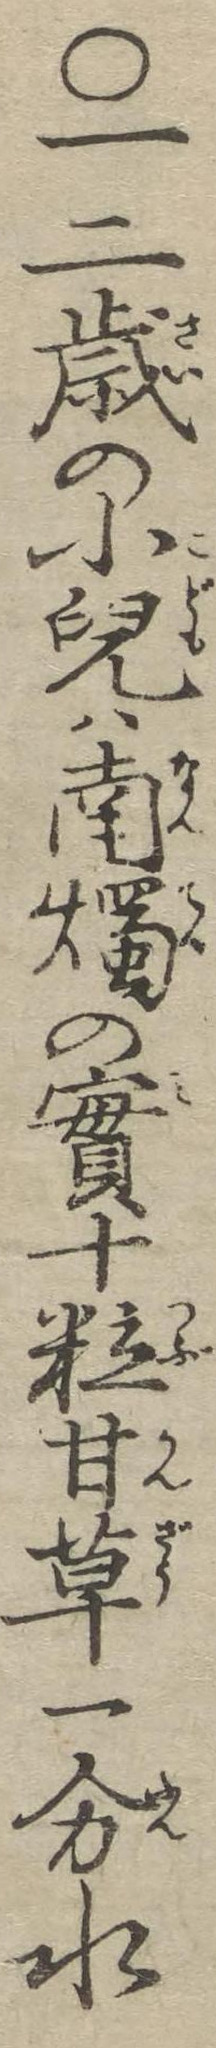○一二歳の小児は南燭の実十粒甘草一分水
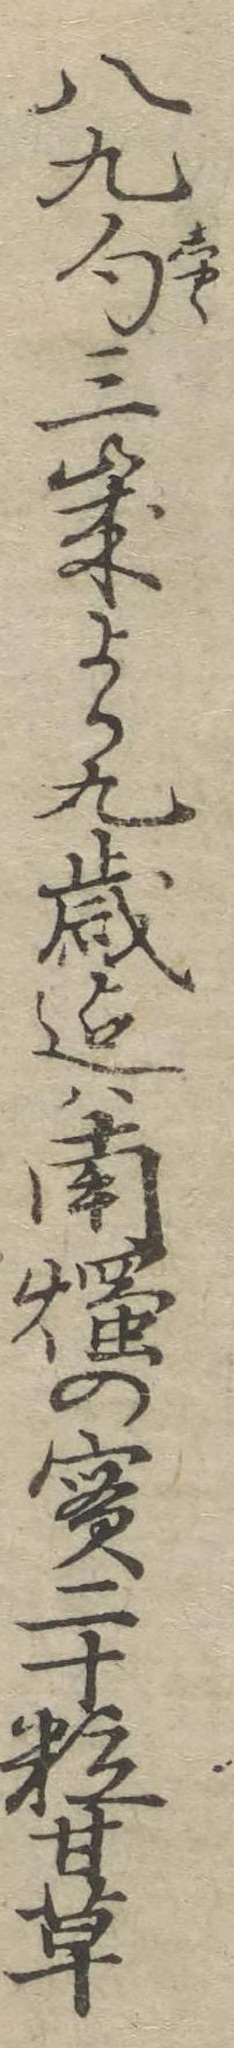八九勺三歳より九歳迠は南燭の実二十粒甘草
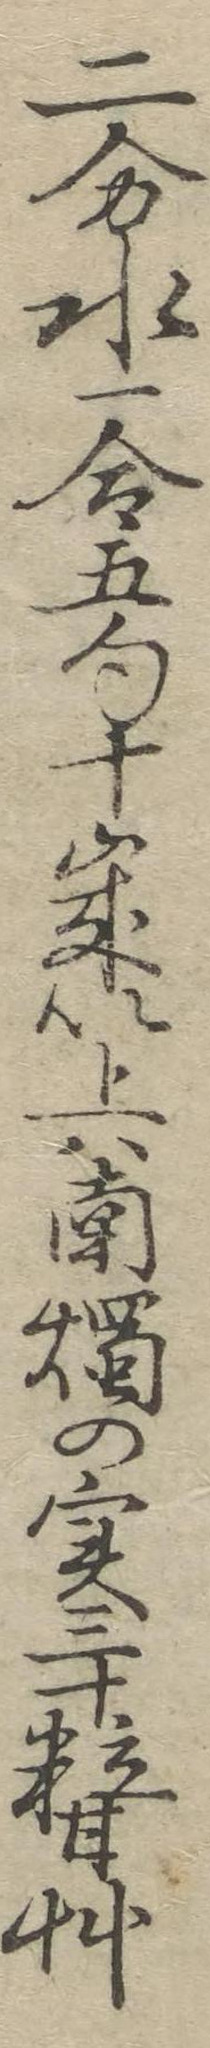二分水一合五勺十歳以上は南燭の実三十粒甘草
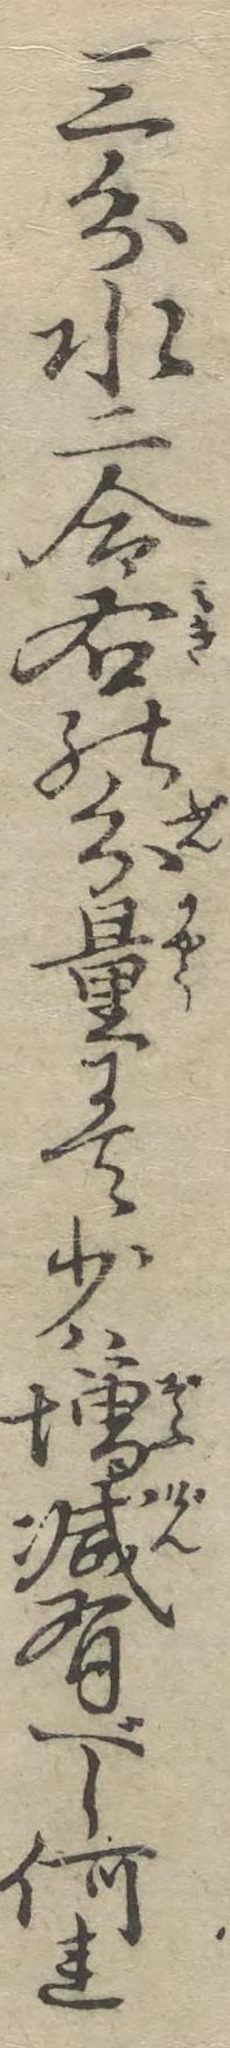三分水二合右の分量にて少は増減有べし何れ
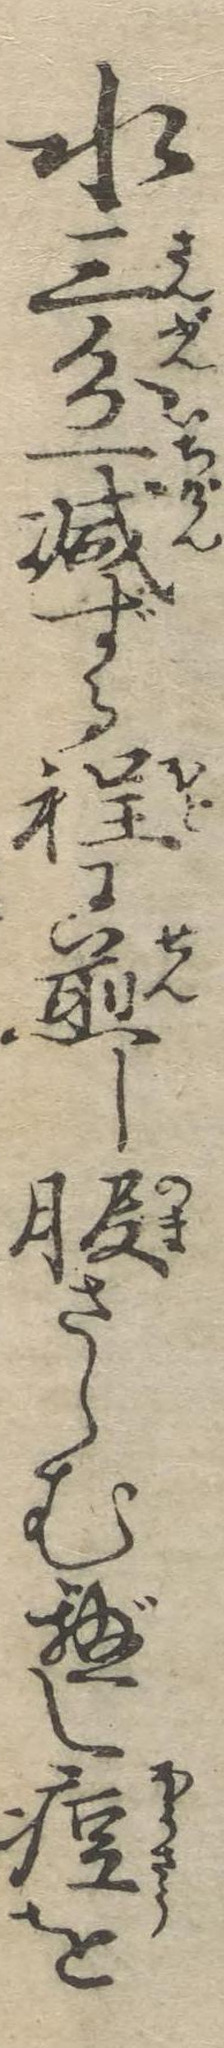水三分一減ずる程に煎し服さしむべし痘を
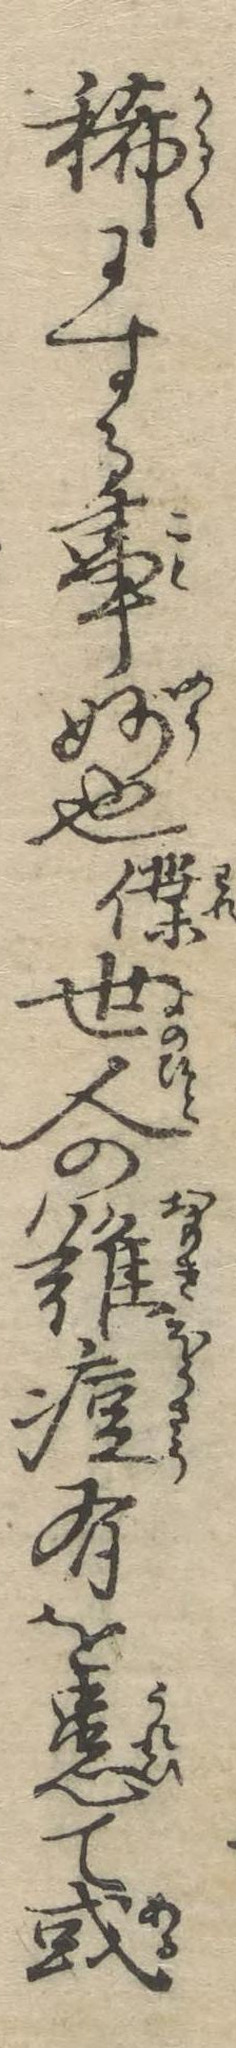稀にする事妙也僕世人の難痘有を患て或
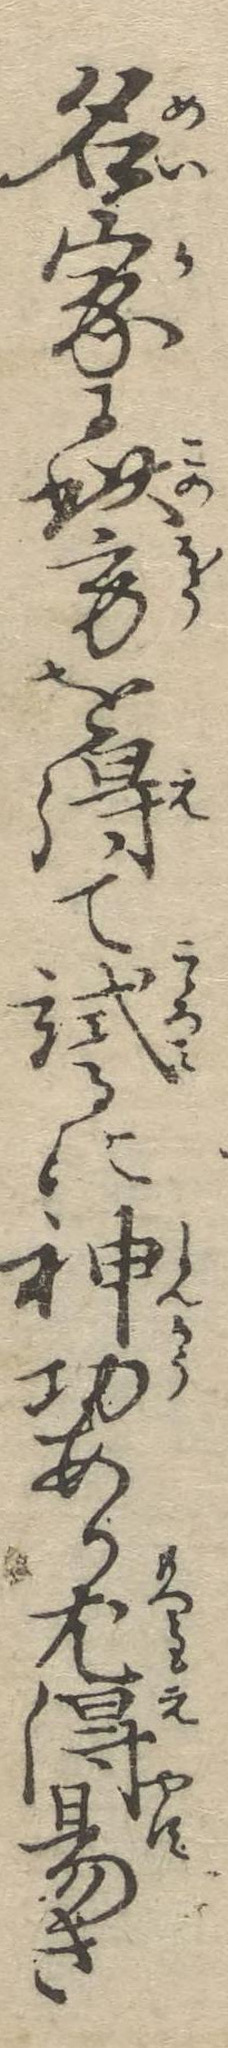名家に此方を得て試るに神功あり尤得易き
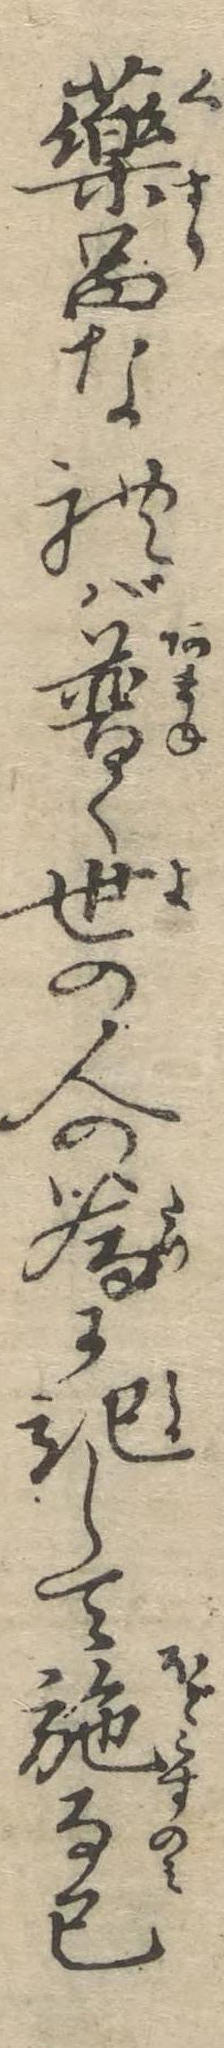薬品なれば普く世の人の為に記して施而已
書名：浪華薬種問屋能書張交帖. 二
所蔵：国立国会図書館 National Diet Library, JAPAN
